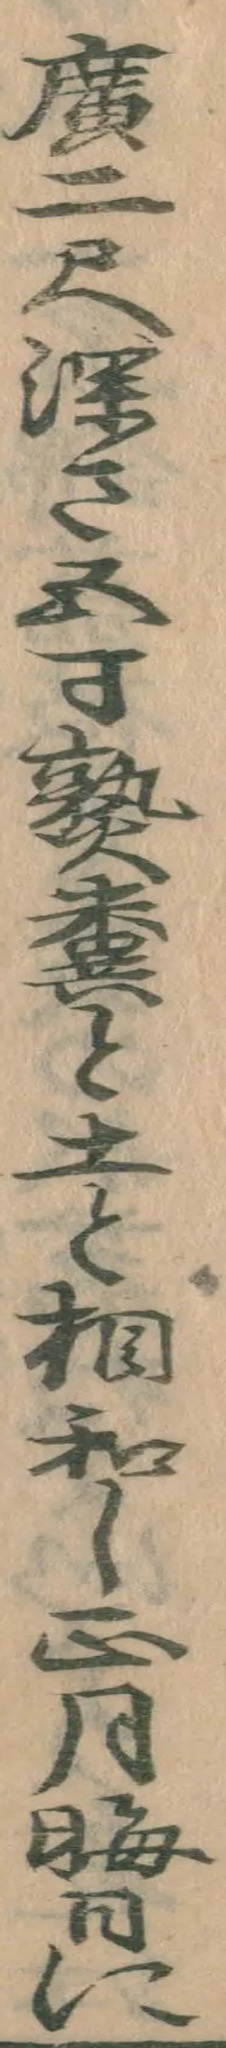広二尺深さ五寸熟糞と土と相和し正月晦日に
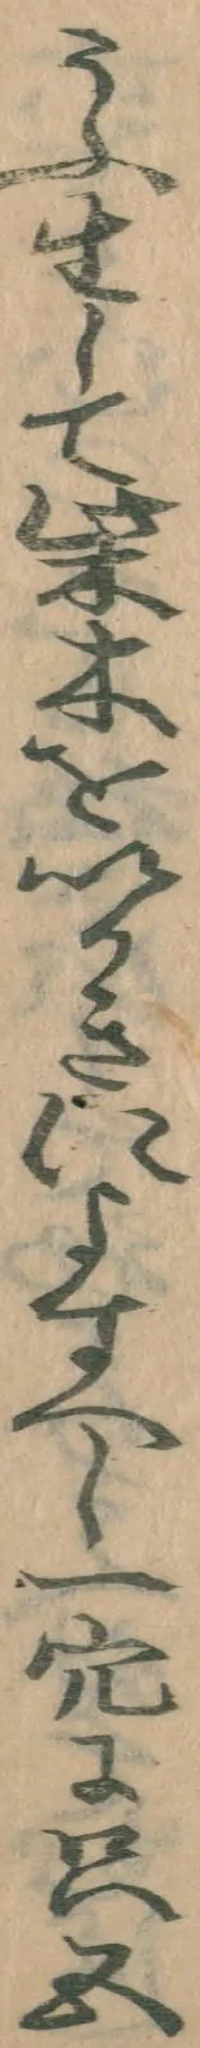うふ生して柴木をいかきによすへし一穴に只五

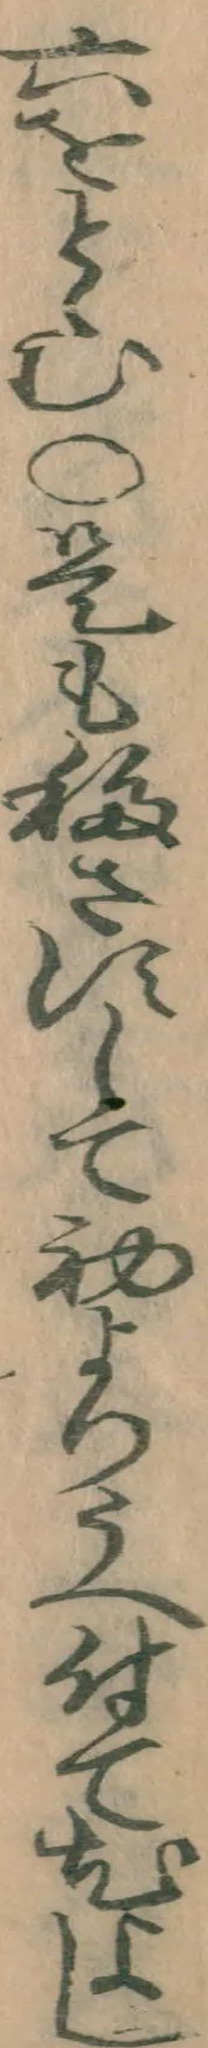六をとゝむ〇是も移さすして初よりうへ付て尤よし
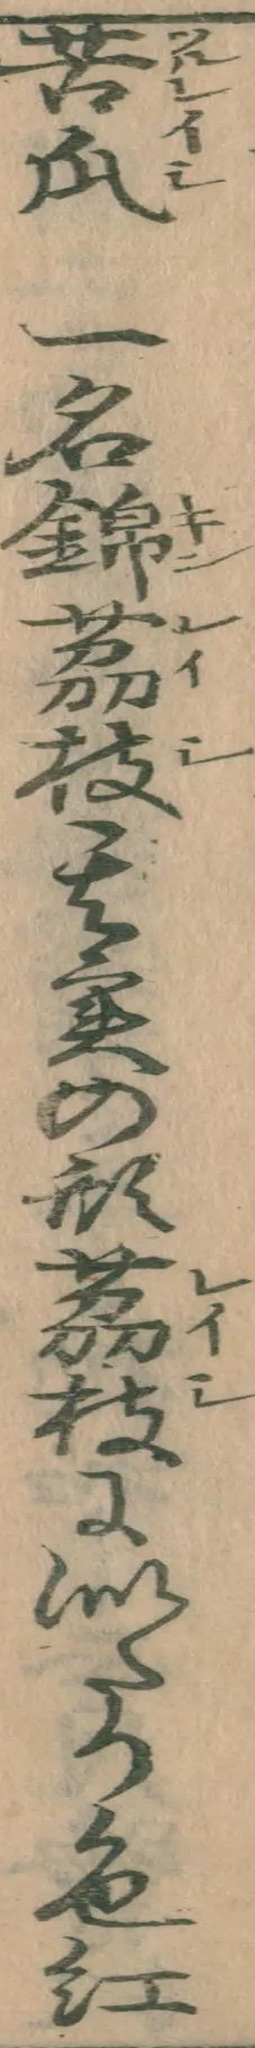苦瓜一名錦茘枝其実の形茘枝に似たり色紅
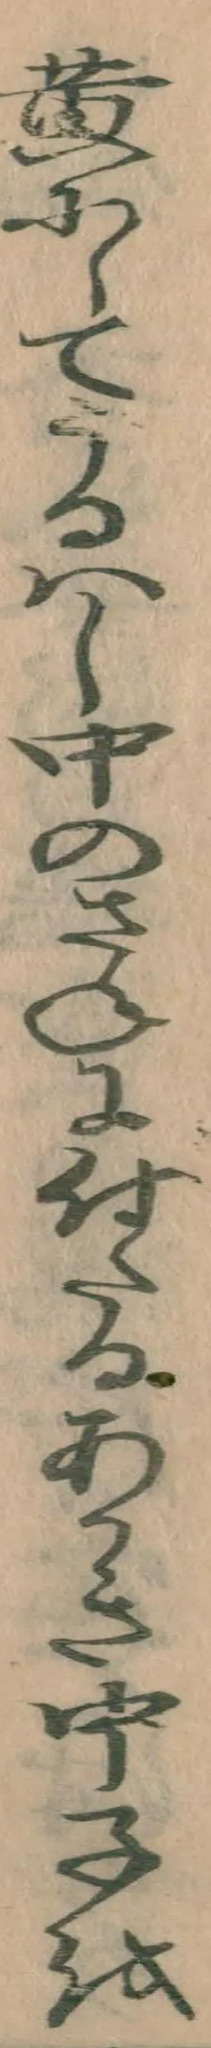黄にしてうるはし中のさねに付たるあかき中子を
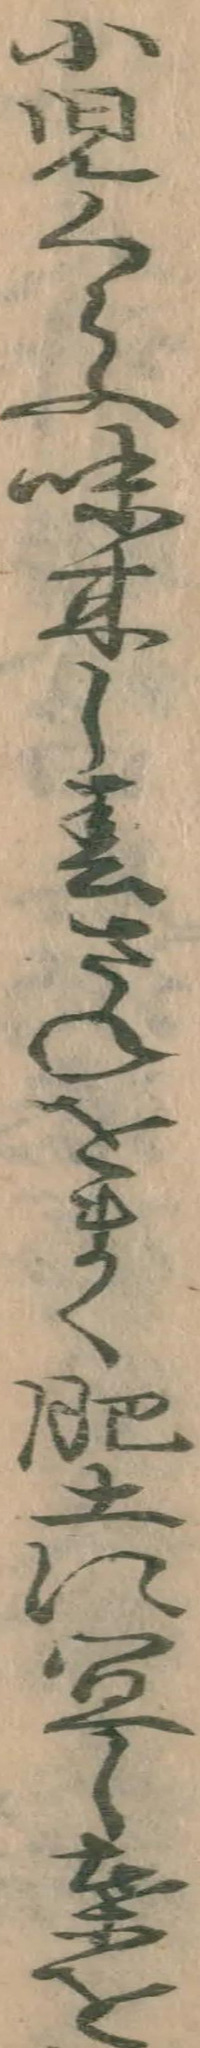小児くらふ味甘し春さねをまく肥土に宜し葉を
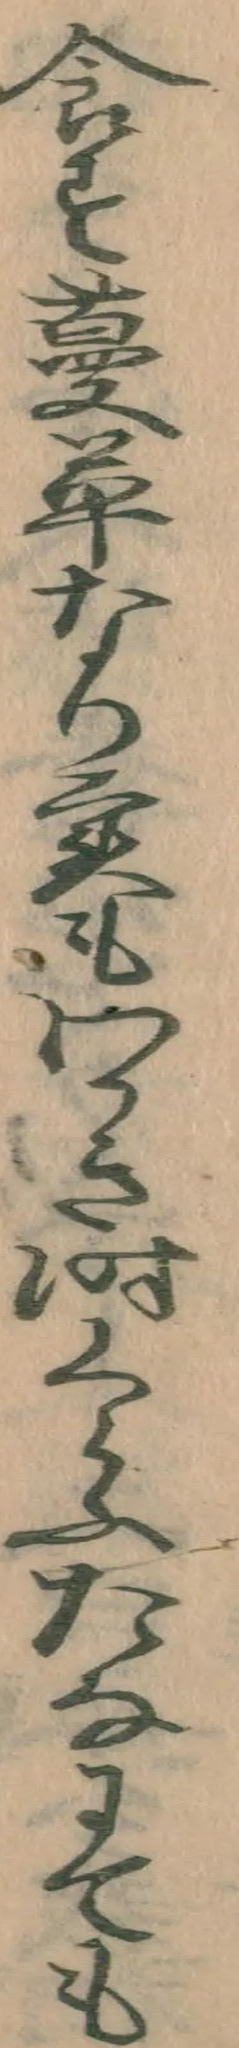食す蔓草なり実もわかき時くらふたなにても
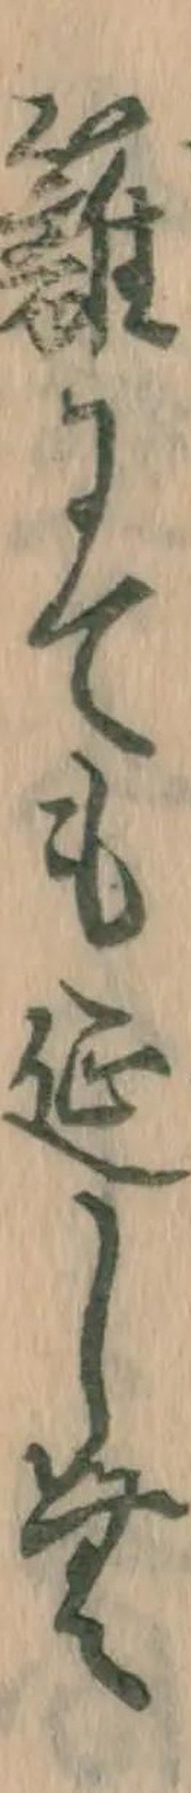籬にても延し無
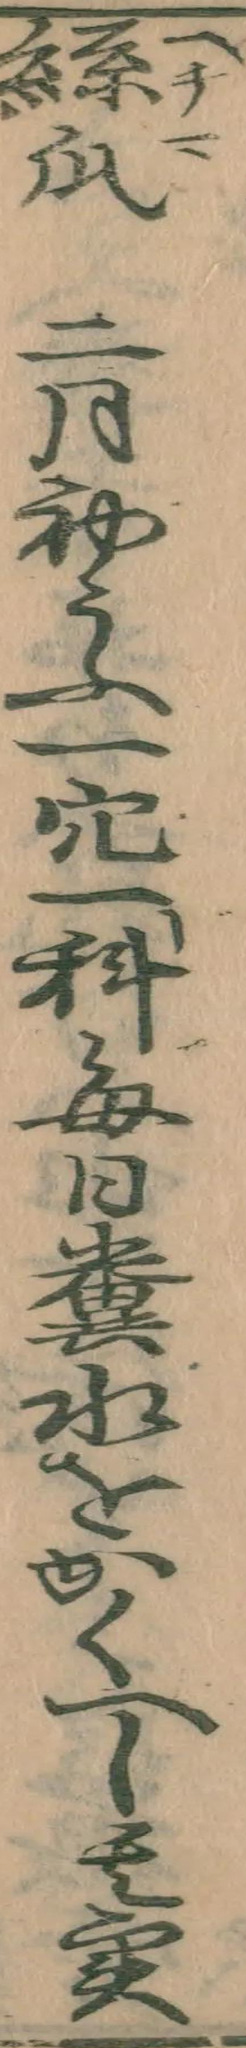絲瓜二月初うふ一穴一科毎日糞水をかくへし其実
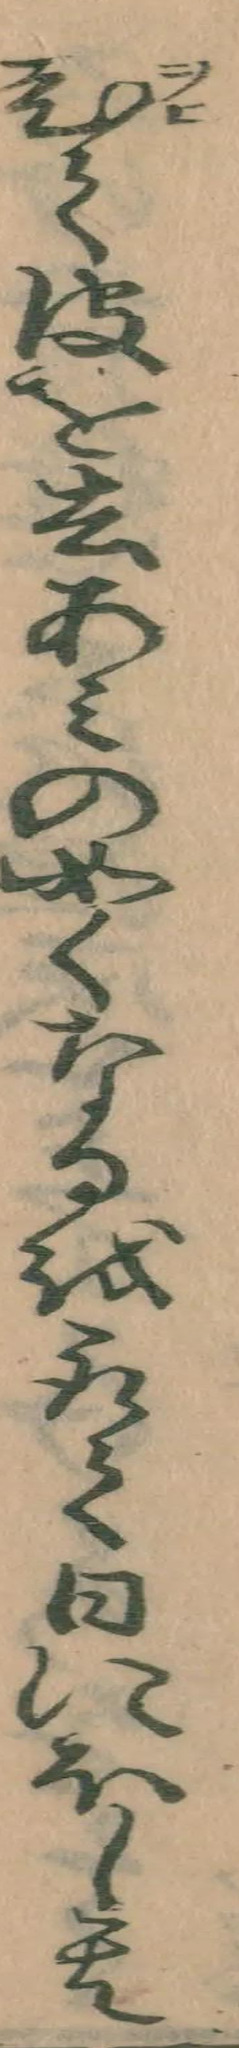老て河皮を去あみの如くなるを取て日にほし其
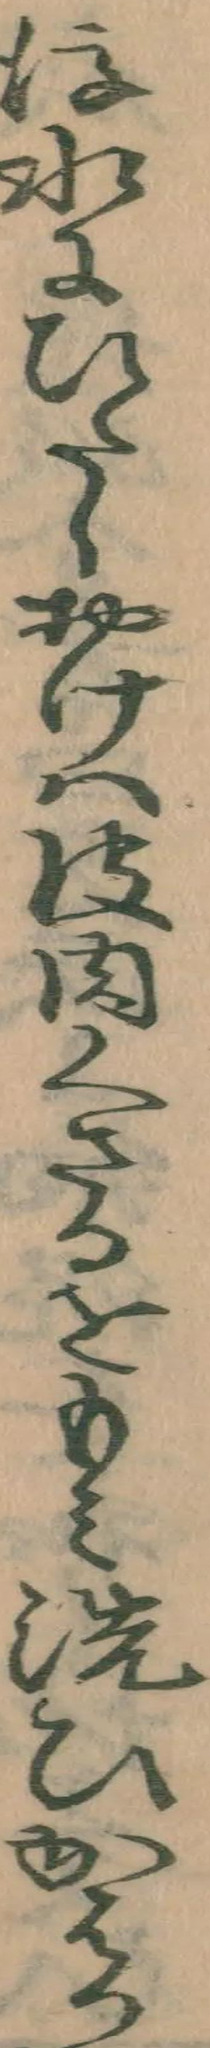後に水にひたしおけは皮肉くさるをもみ洗ひかはか
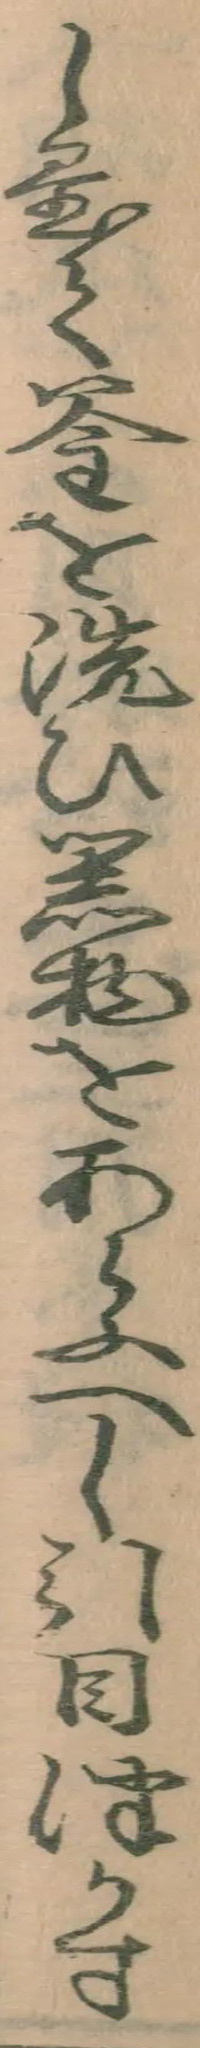し置く釜を洗ひ黒物とあらふへし引目つくす
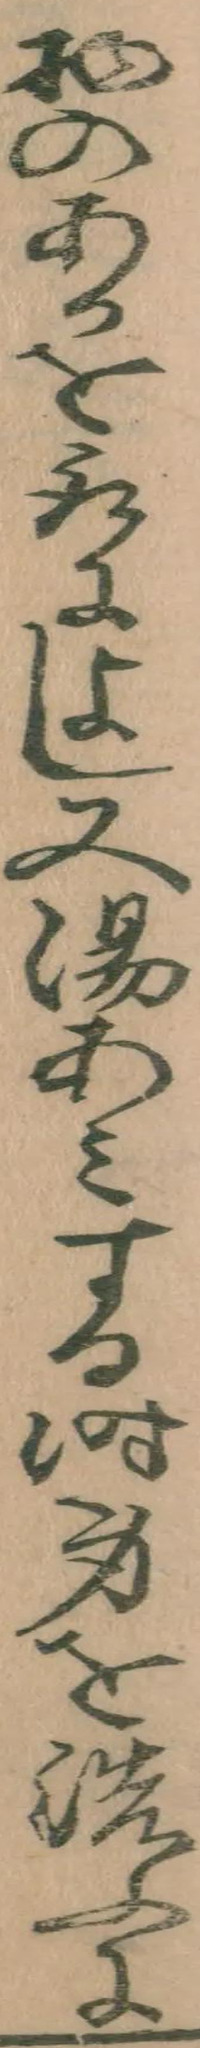おのあかを取によし又湯あみする時身を洗ふに
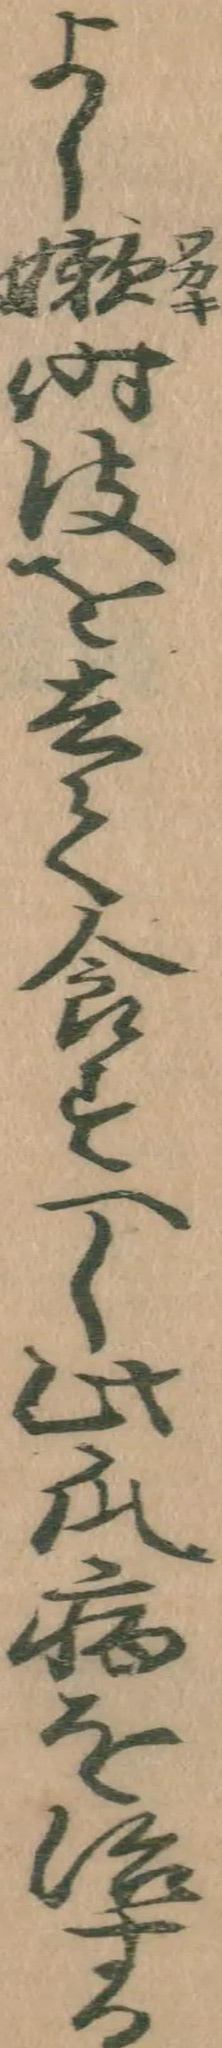よし嫩時皮を去て食すへし此瓜病を治する
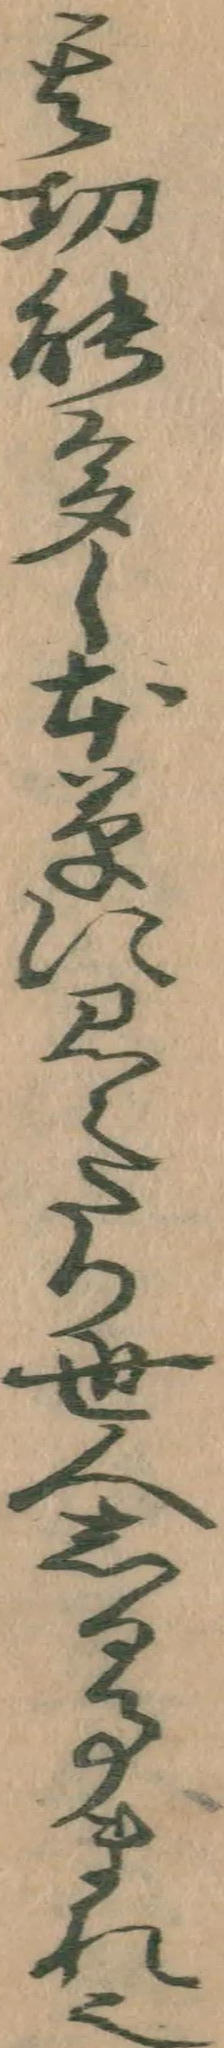其効能多し本草に見たり世人しる事まれ也

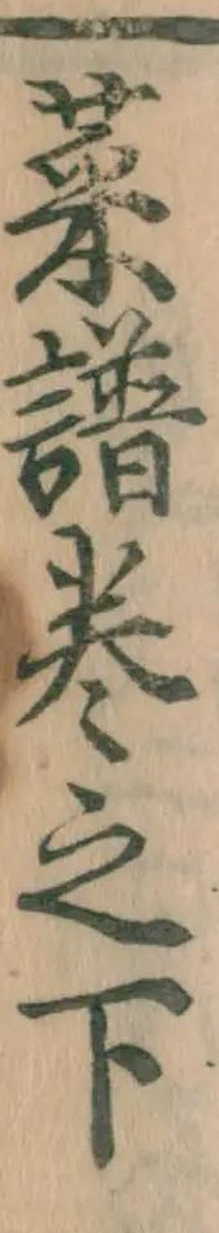菜譜巻之下
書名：菜譜 3巻
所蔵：国立国会図書館 National Diet Library, JAPAN
